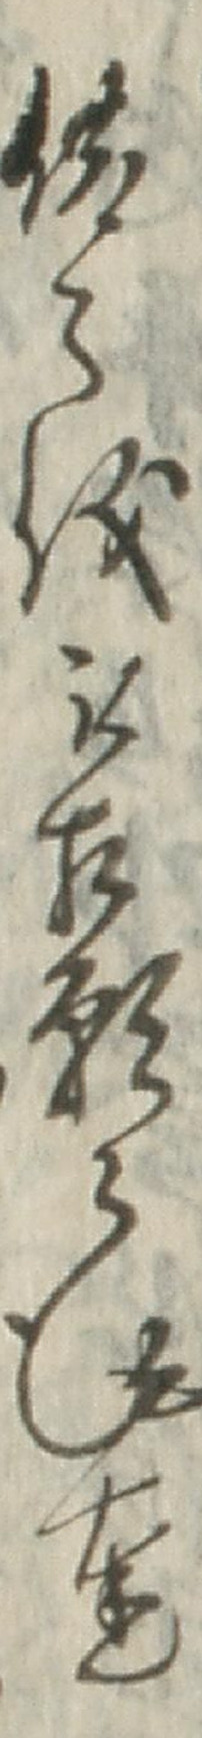借之儀被相願候趣達
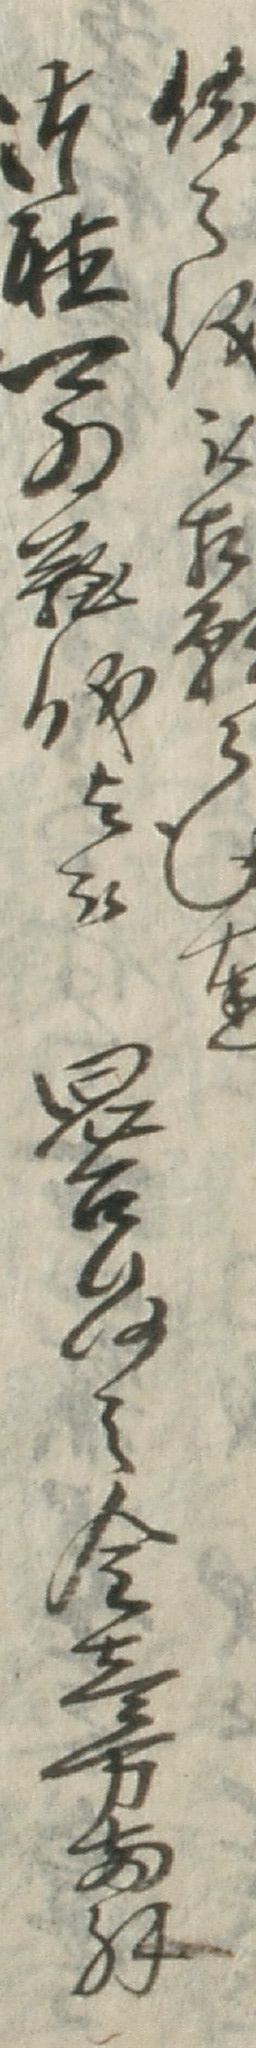御聴可為難儀と被思召候仍之金壱萬両拝
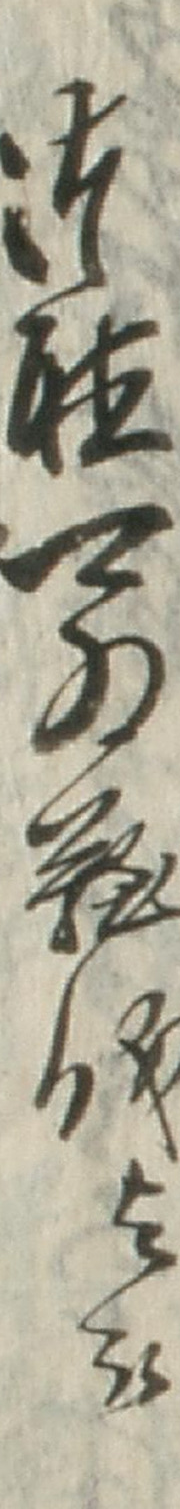御聴可為難儀と被
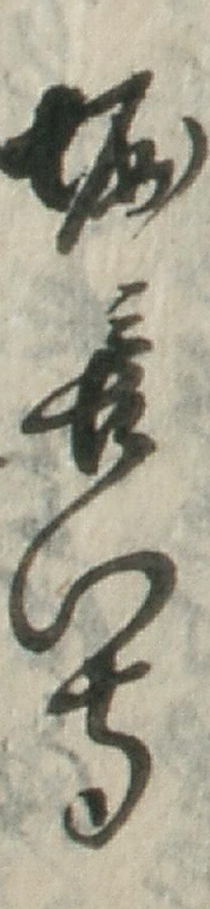堀長門守
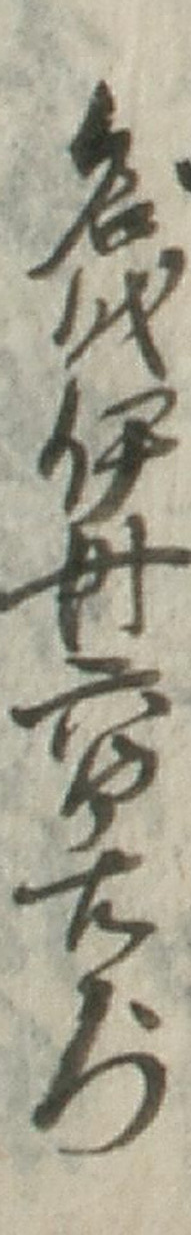名代伊丹六郎右衛門
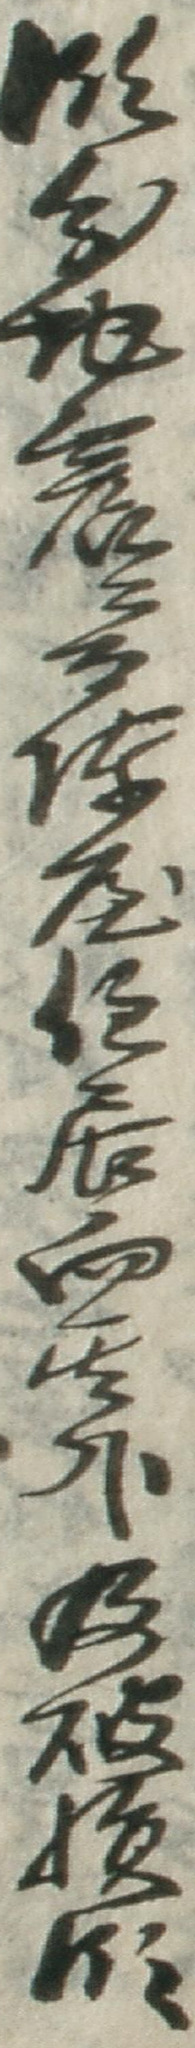領分地震二而陣屋住居向其外及破損領
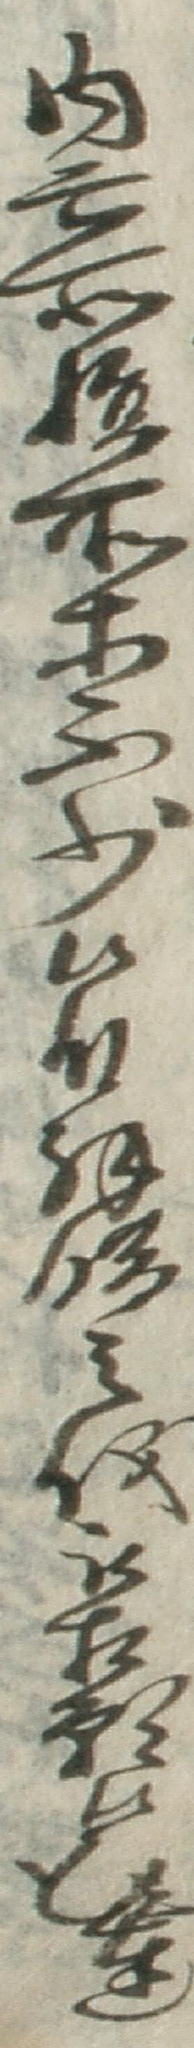内亡所損所等不少候付拝借之儀被相願候趣達
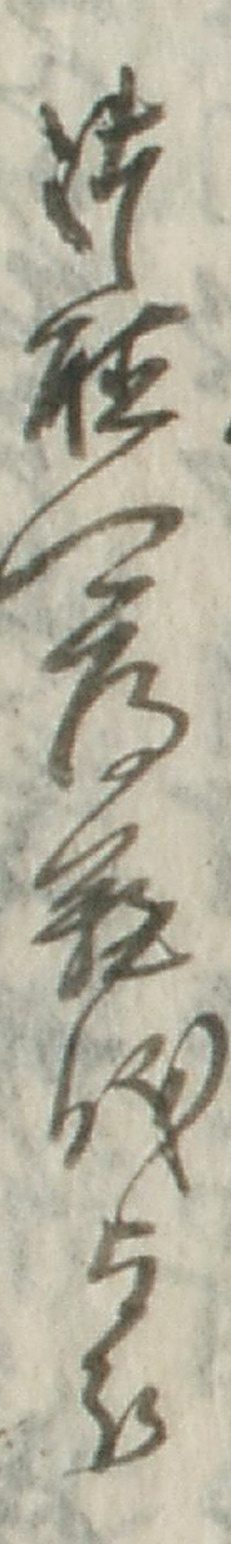御聴可為難儀と被
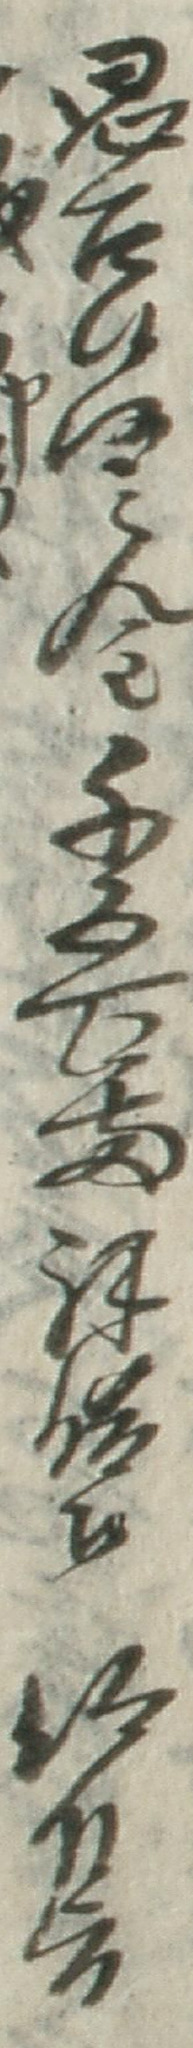思召候仍之金千五百両拝借被仰付旨
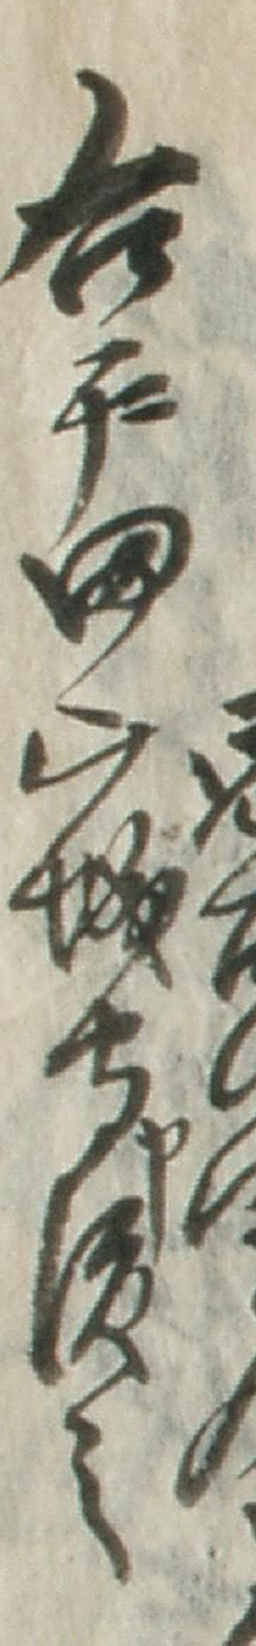右戸田山城守申渡之

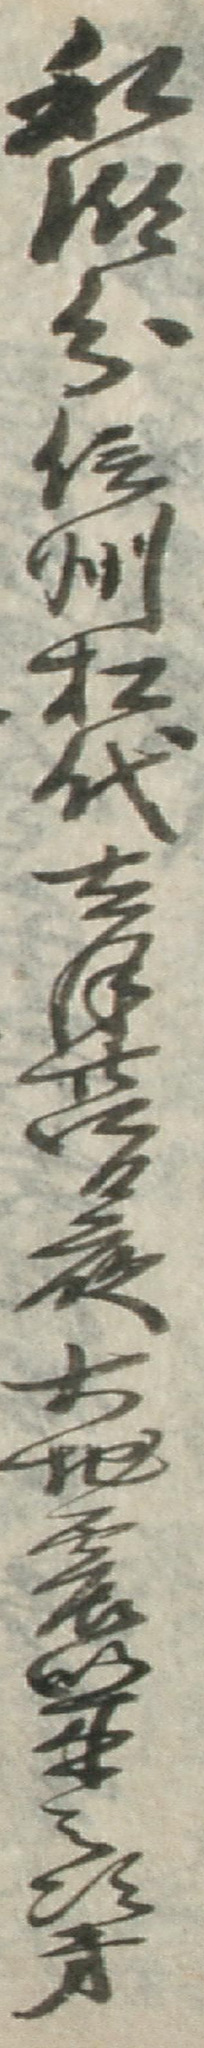私領分信州松代去月廿四日夜大地震以来之次第
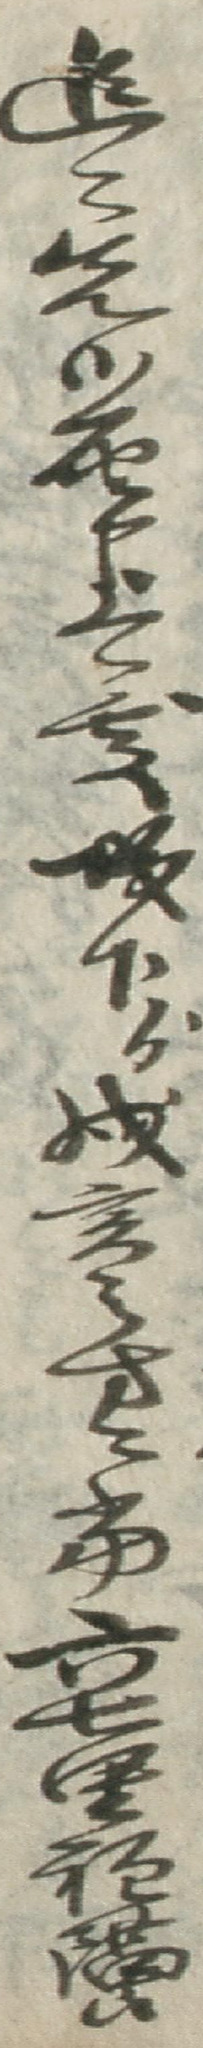追々先御届申上候処城下ゟ戌亥之方二当六七里程隔候
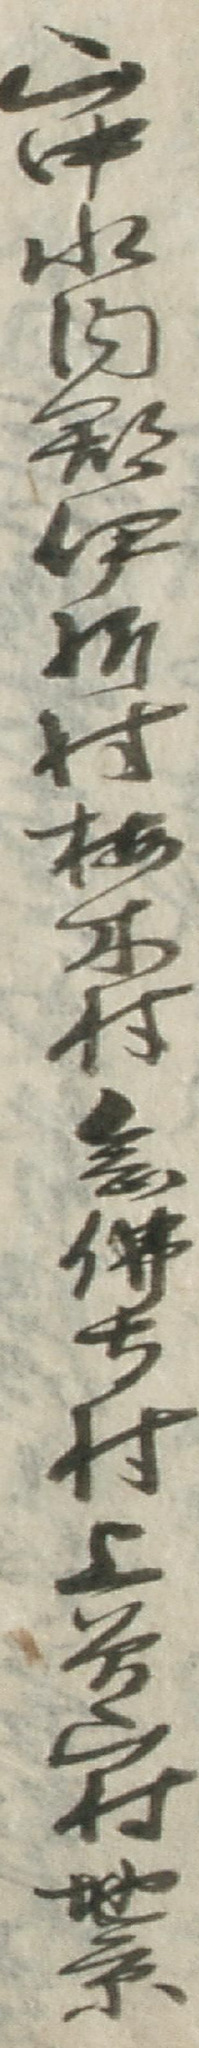山中水内郡伊折村梅木村念仏寺村上曾山村地亰
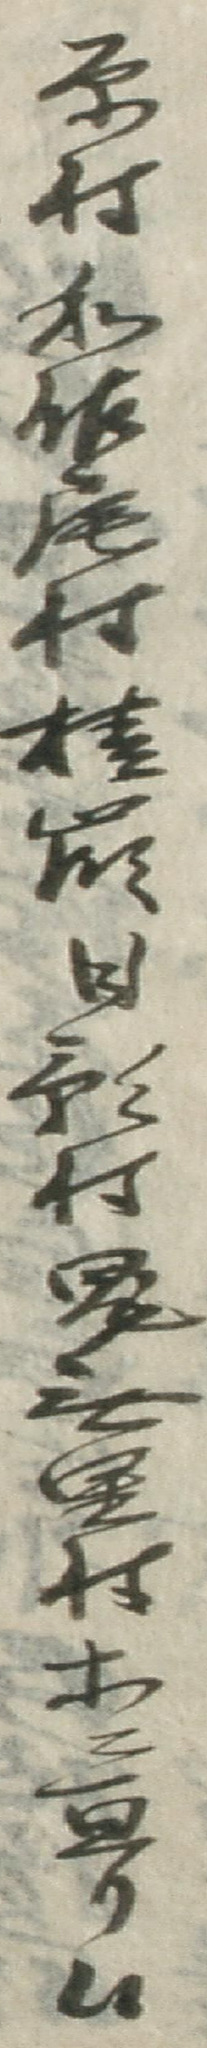原村和佐尾村椿嶺日影村鬼無里村等二亘り候
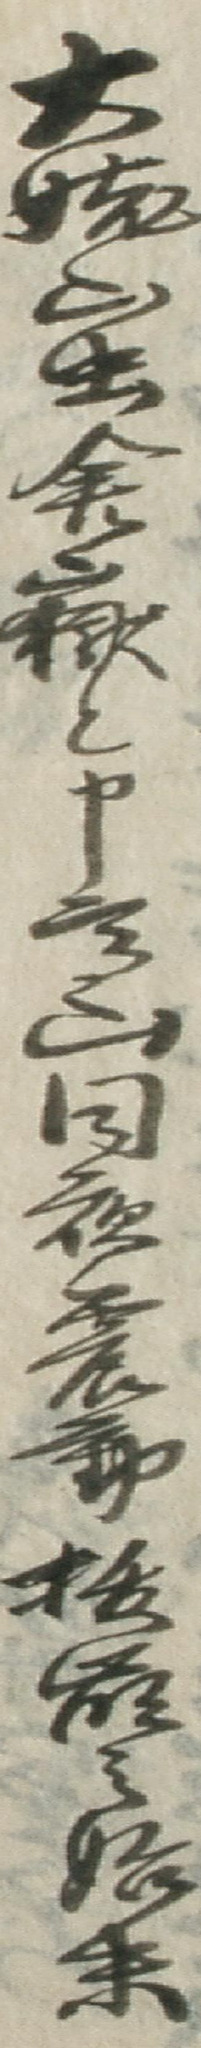大姥山虫倉嶽と申高山同夜震動抜崩候始末
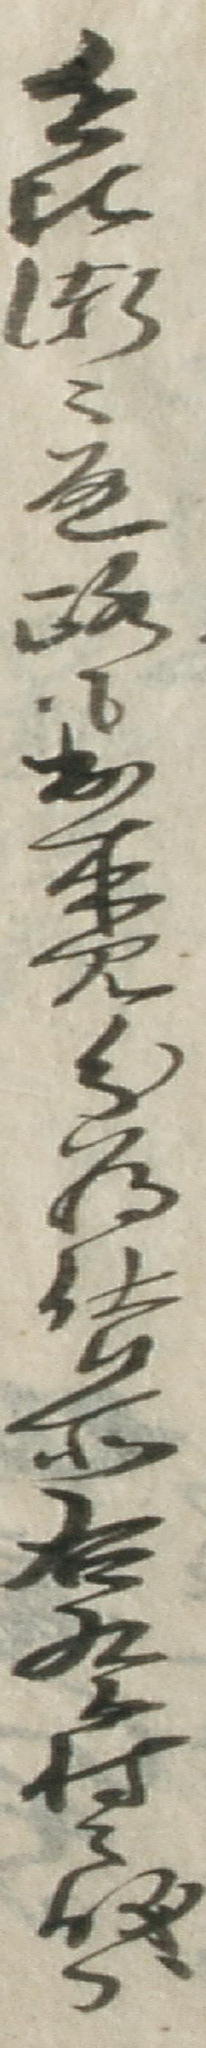近頃漸々通路も出来見分為仕候処右九ヶ村之儀ハ
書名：信濃國地震實録記
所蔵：東京大学地震研究所図書室 Earthquake Research Institute Library, The University of Tokyo, JAPAN
